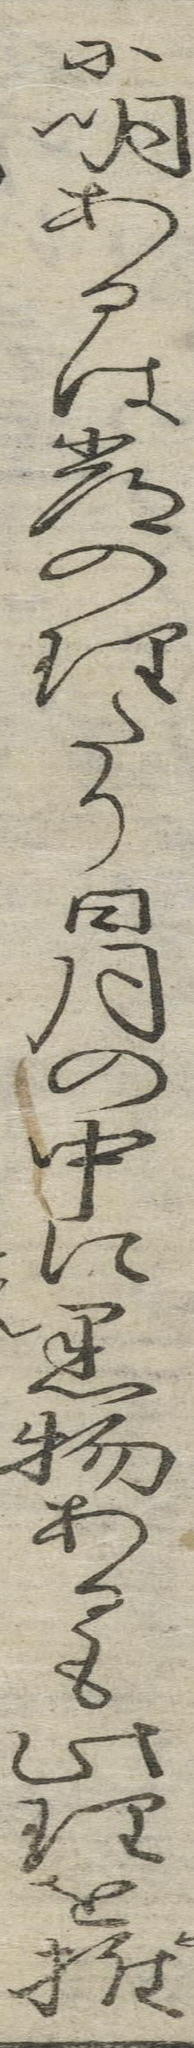に明あるは道の理たり日月の中に黒物あるも此理を推
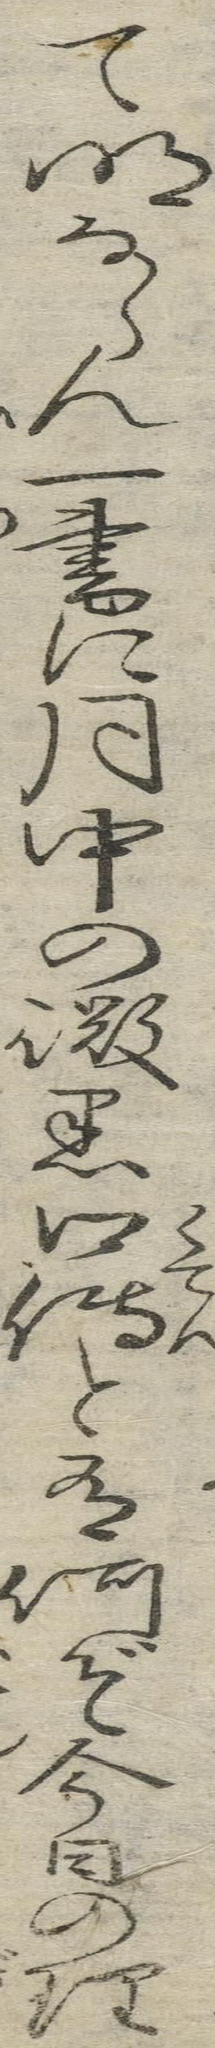て明ならん一書に月中の微黒口伝と有何ぞ今日の理
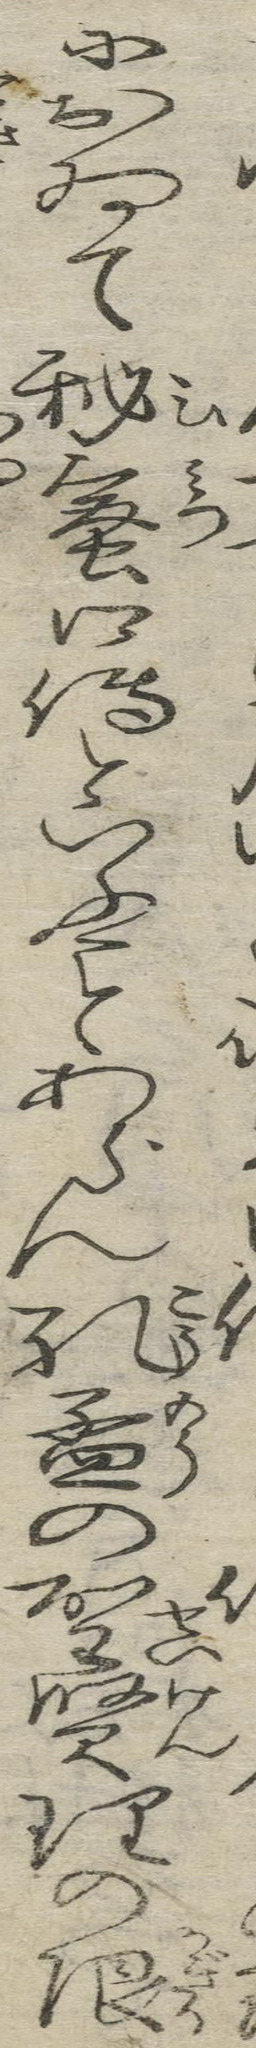におゐて秘蜜口伝といふことあらん孔孟の聖賢理の限
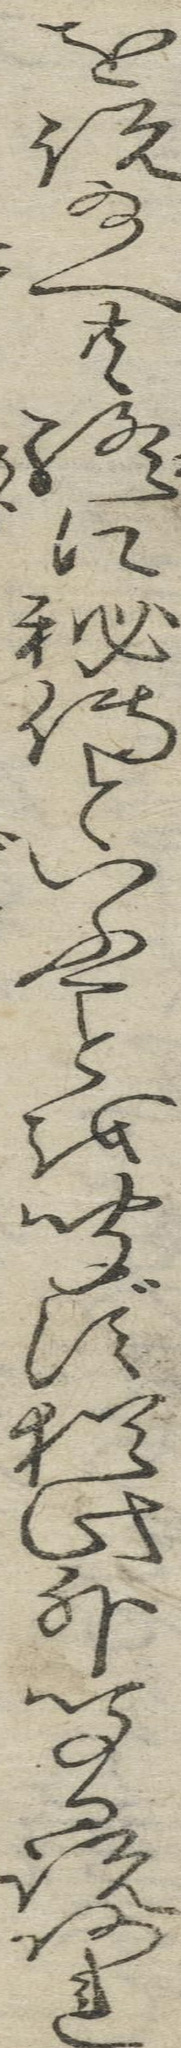を説給へ共終に秘伝といふことを聞ず猶此外聞る説あれ
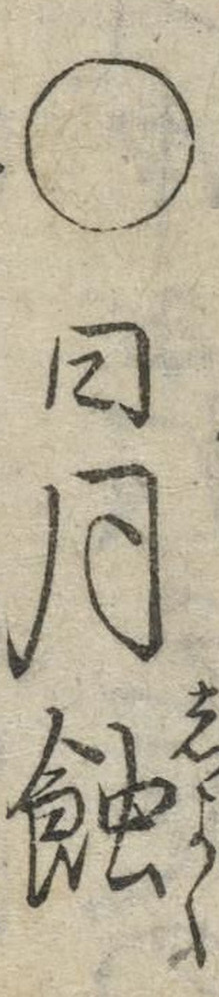○日月蝕
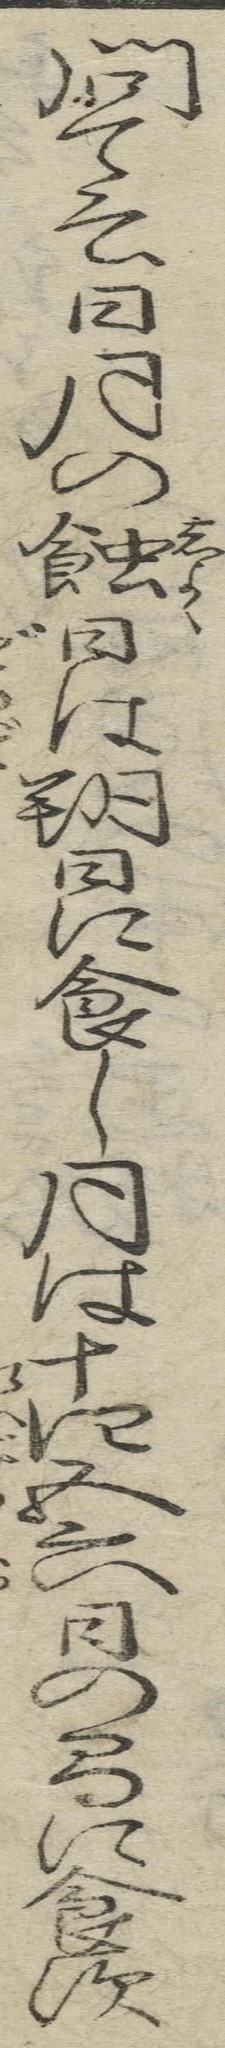問て云日月の蝕日は朔日に食し月は十四五六日の間に食す
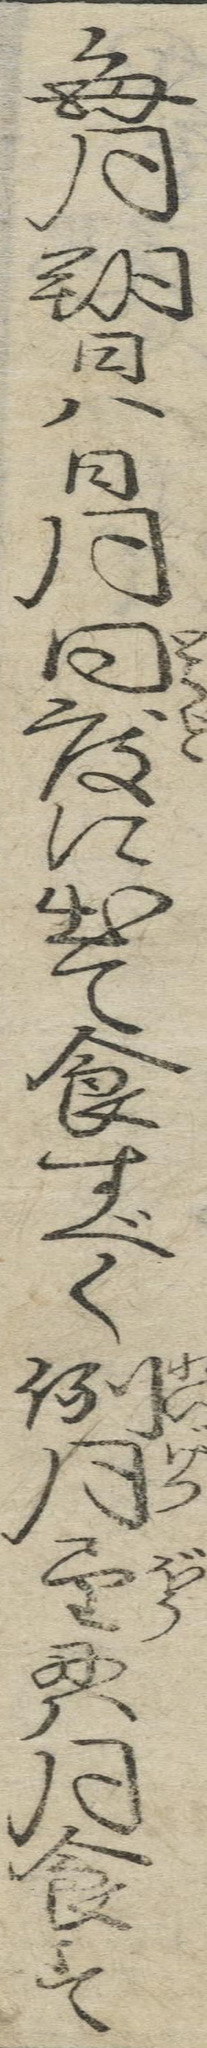毎月朔日は日月同度に出て食すべく例月望には月食す
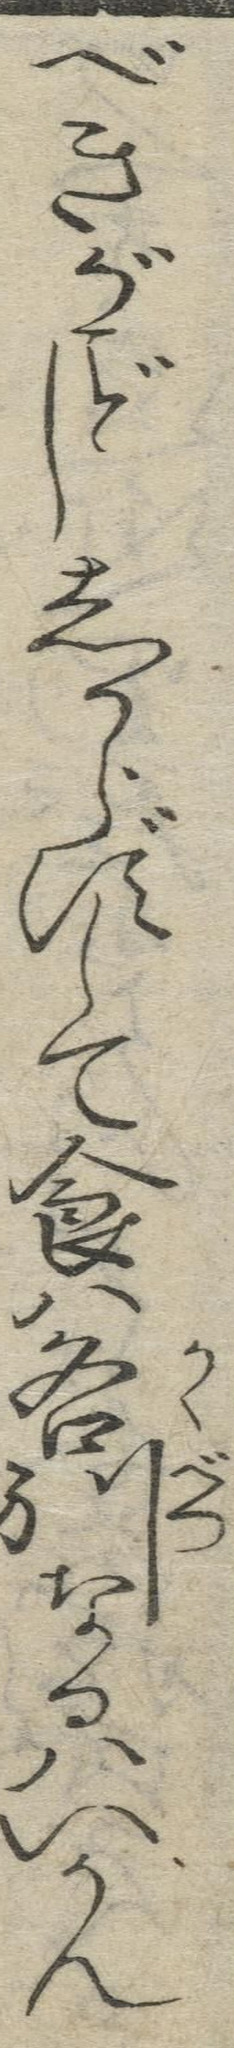べきがごとししからずして食は各別なるはいかん
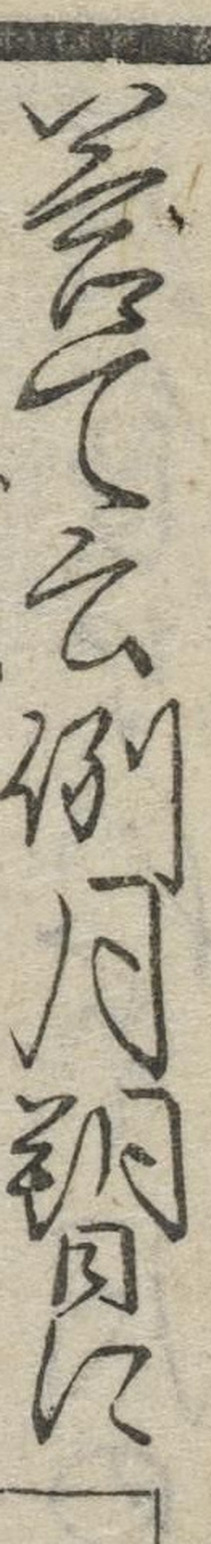答て云例月朔日に
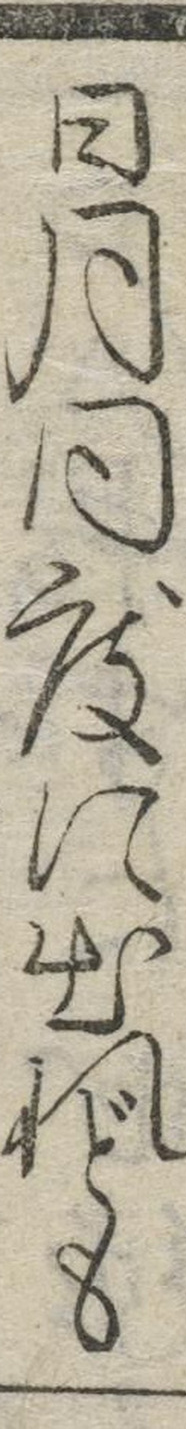日月同度に出れども
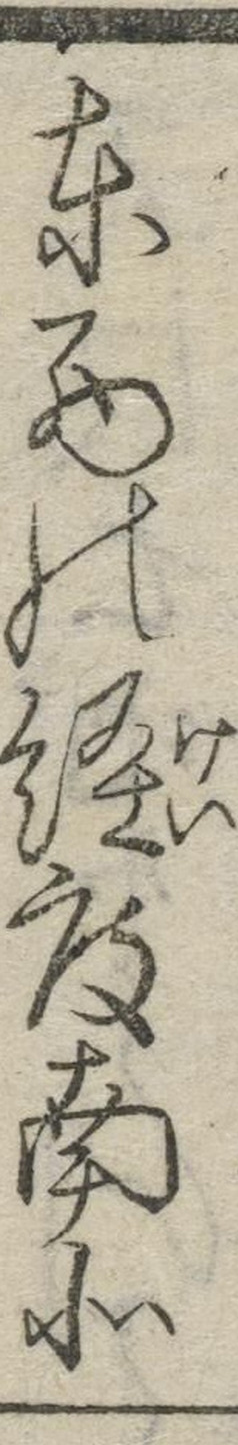東西の経度南北
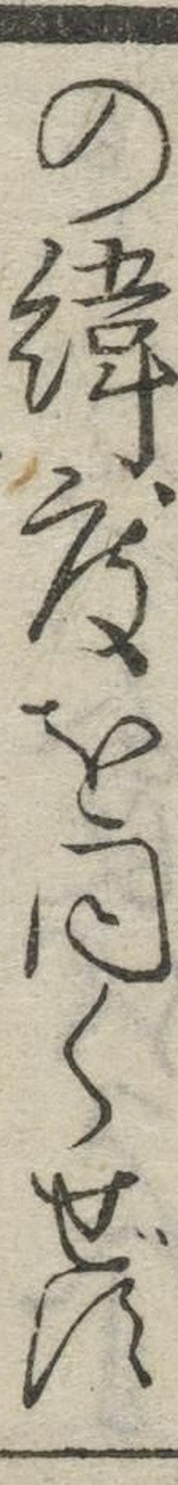の緯度を同くせず
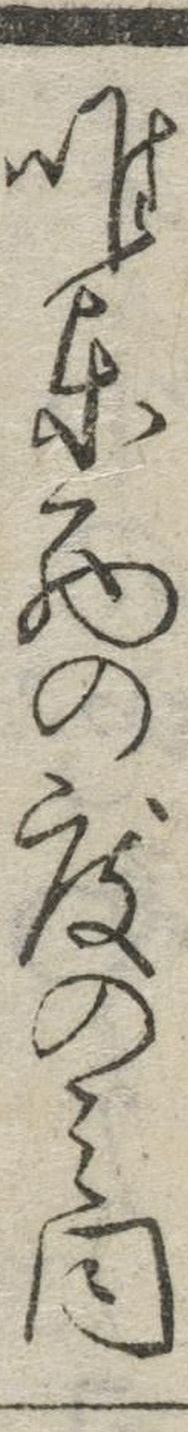唯東西の度のみ同
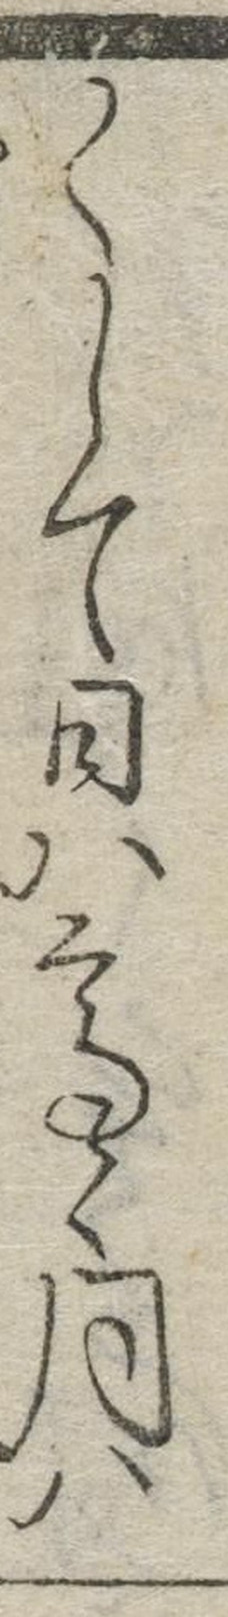くして日は高く月は
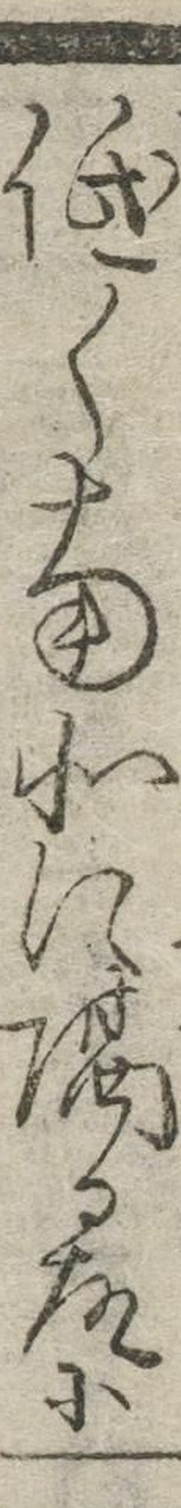低く南北に隔る故に
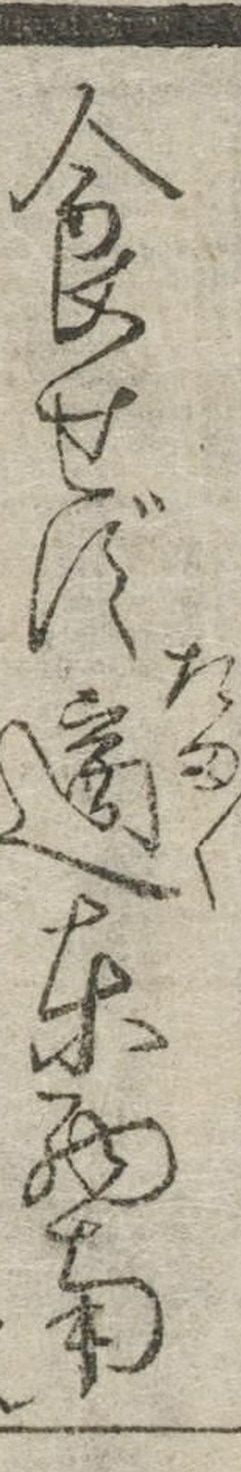食せず適東西南
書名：訓蒙天地辨　天
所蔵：東京大学地震研究所図書室 Earthquake Research Institute Library, The University of Tokyo, JAPAN
